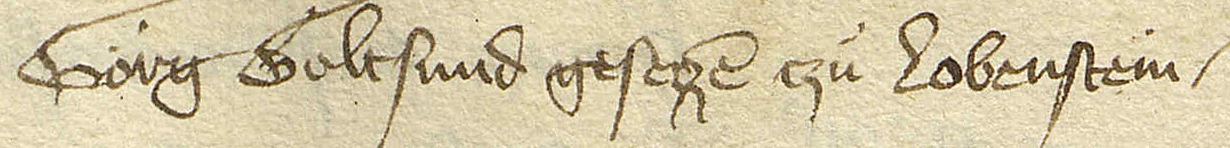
Görg Goltſund geſeʒʒe* cʒü Lobenſtein /
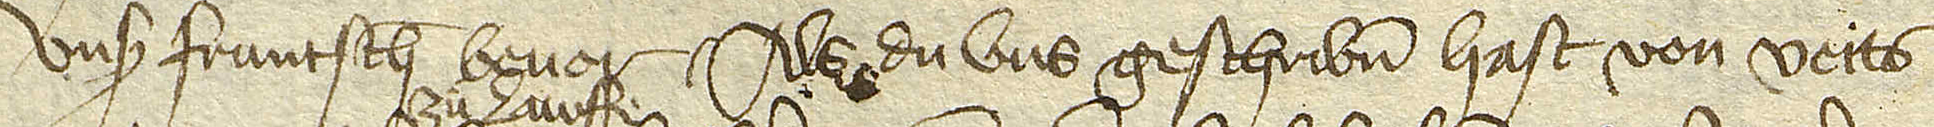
Vnſ* fruntſch* beuor / Als du vns geſchribn* haſt von Veits
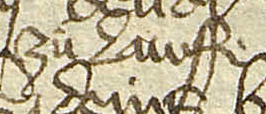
cʒü Lawffe
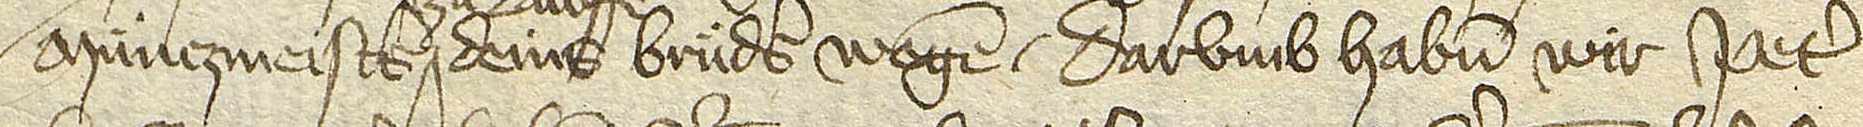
Müncʒmeiſts* deins brüds* wege* / Darvmb habn* wir Pet*
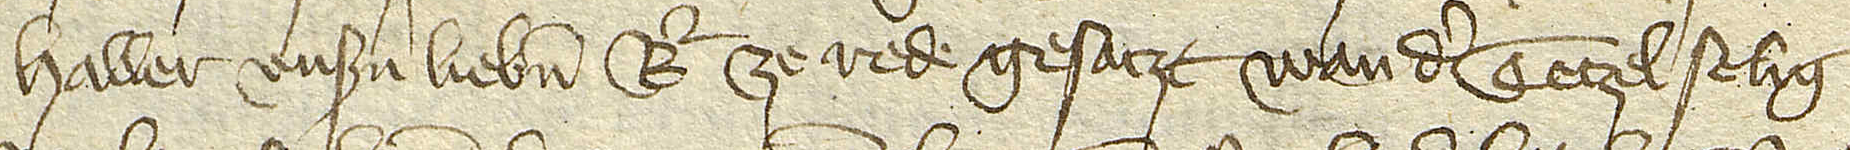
haller vnſ*n liebn* B* cʒe rede geſacʒt wan d* Tecʒel ſelig
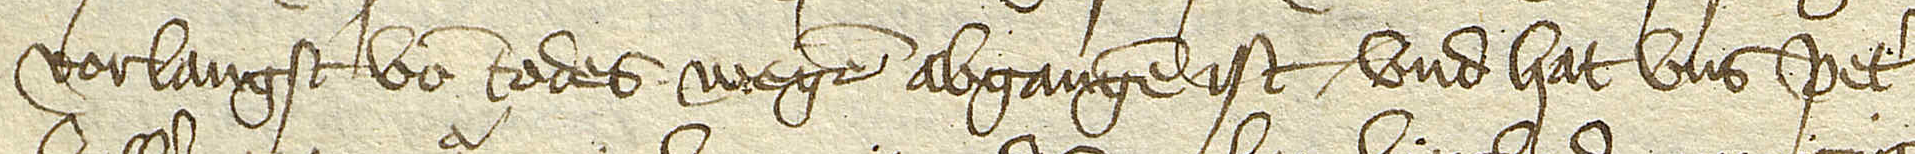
vorlangſt vo* todes wege* abgange* iſt / vnd hat vns Pet*
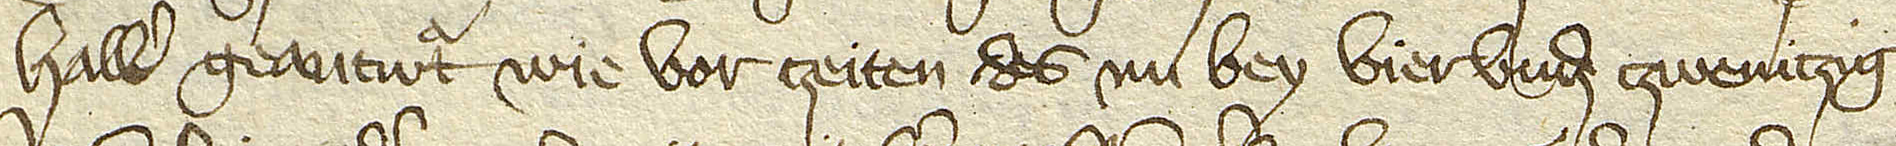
hall* geantw*t wie vor cʒeiten / des nu bey vier vnd cʒweincʒig
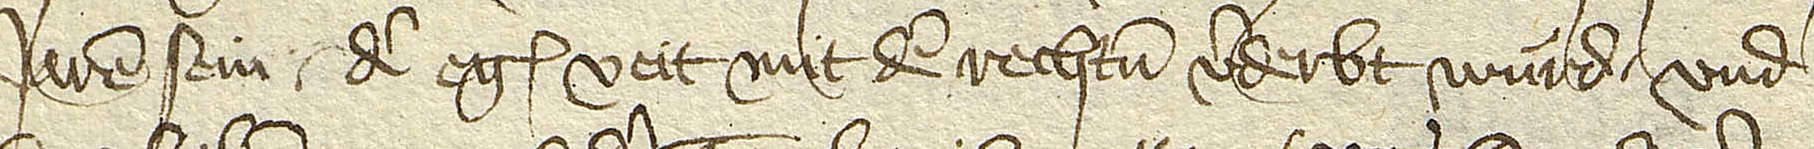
Iare* ſein / d* eg* Veit mit d* rechtn* v*derbt würd / vnd
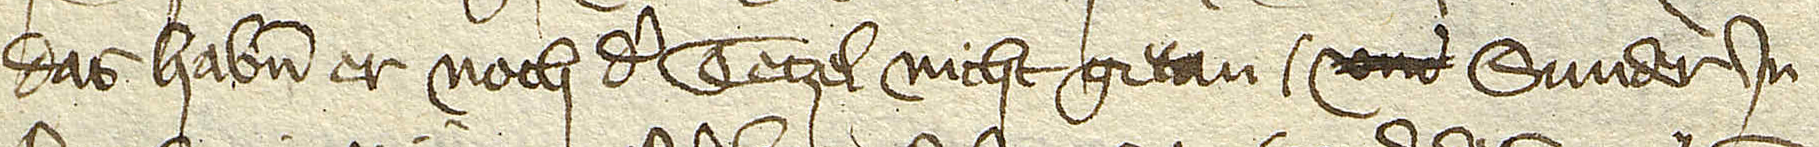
das habn* er noch d* Tecʒel nicht getan / vnd Sunder In
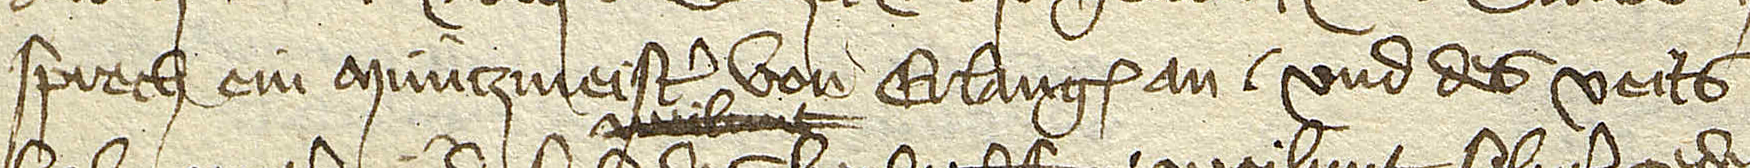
ſprech ein Müncʒmeiſt* von Erlang* an / vnd des veits
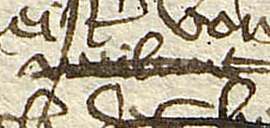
weilunt
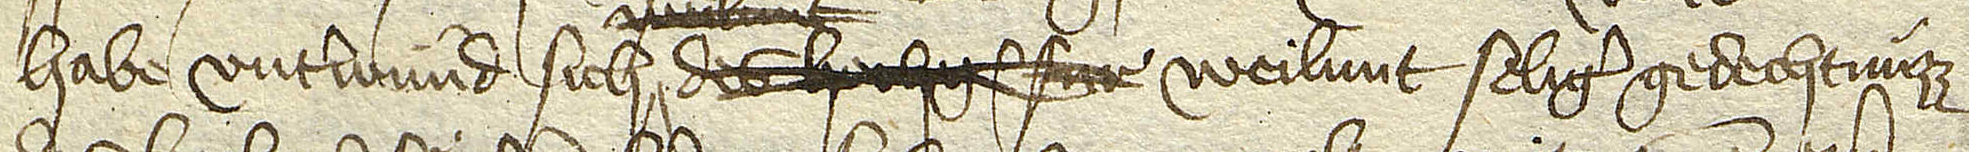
habe vnt*wünd ſich des hochg* fur weilunt ſelig* gedechtnüʒʒ
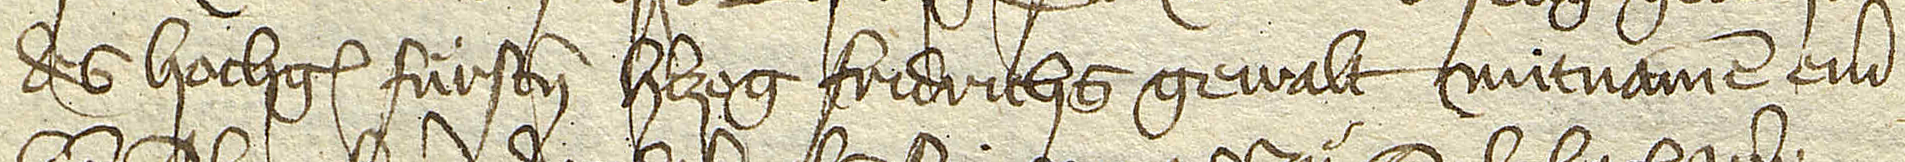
des hochg* fürſtn* h*cʒog fridrichs gewalt mitname* ein*
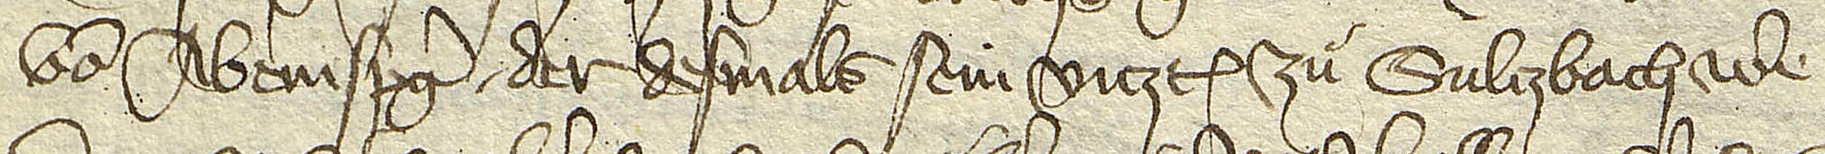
vo* Abemſpg* / der deſmals ſein vicʒt* cʒü Sulcʒbach w*e
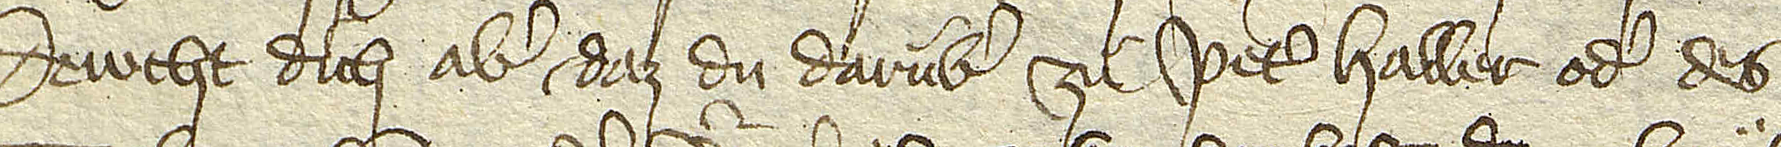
Dewcht dich ab* / daʒ darüb* cʒu Pet* haller od* des
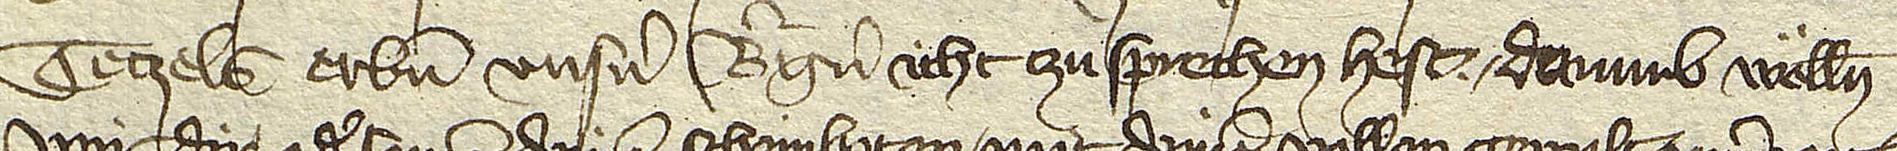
Tecʒels erbn* vnſn* B*gn* icht cʒu ſprechen heſt . / darumb wölln*
